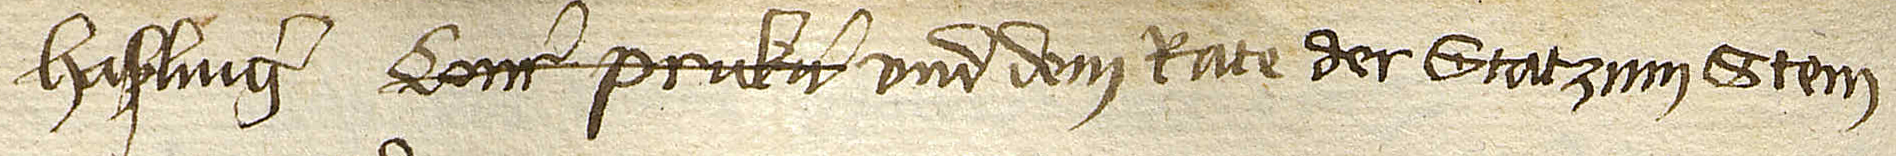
haſ*ling* Conr* prukn* vnd dem Rate der Stat ʒum Stein
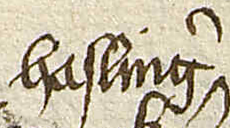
haſſling*
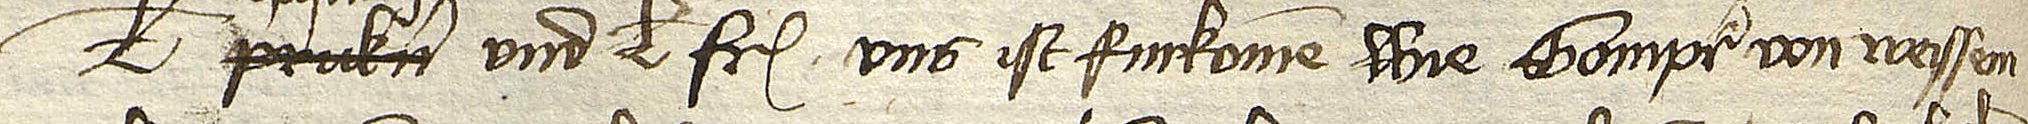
L* prukn* vnd L* fr* / vns iſt furkome* wie Gompr* von weiſſem
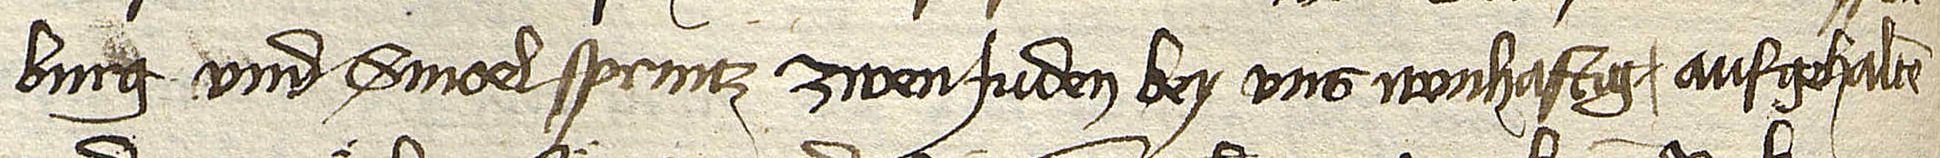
burg vnd Smoel ſprincʒ ʒwen Iuden bey vns wonhaftig / aufgehalte*
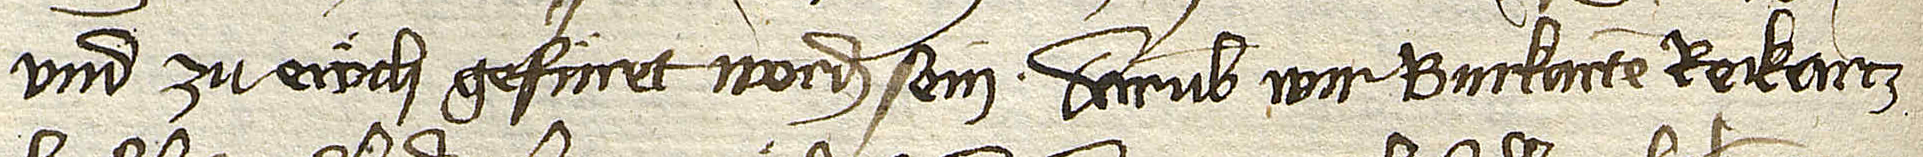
vnd ʒu eẅch gefüret word* ſein . Darub* wir Burkarte* Reikarcʒ
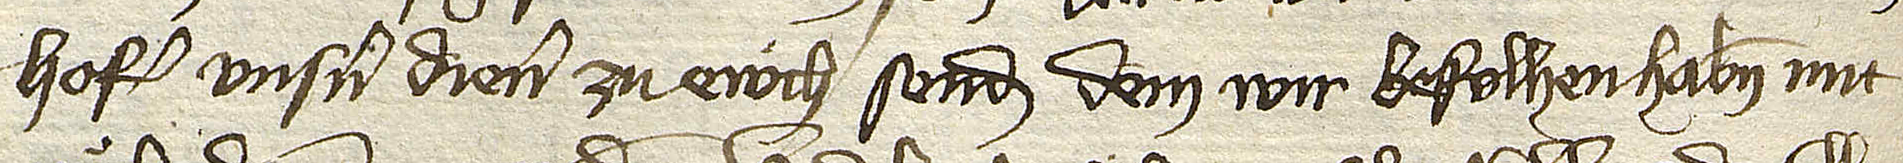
hof* vnſn* dien* ʒu eẅch ſend* dem wir befolhen habn* mit
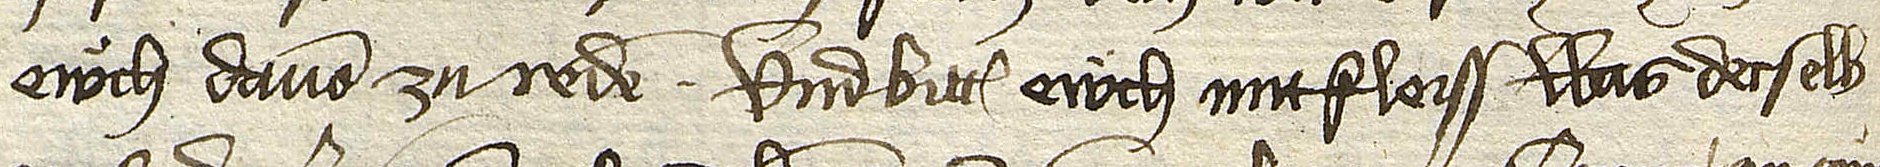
eẅch dauo* ʒu rede* . Vnd bitt* eẅch mit fleiſſ Was derſelb
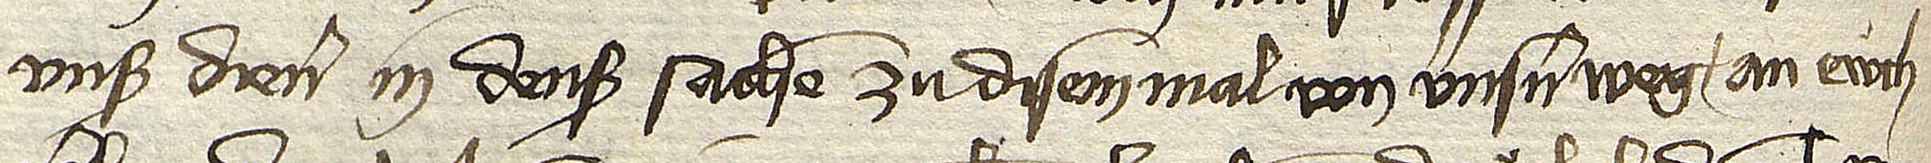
vnſ* dien* in denſ* ſache* ʒu diſem mal von vnſn* weg* an eẅch
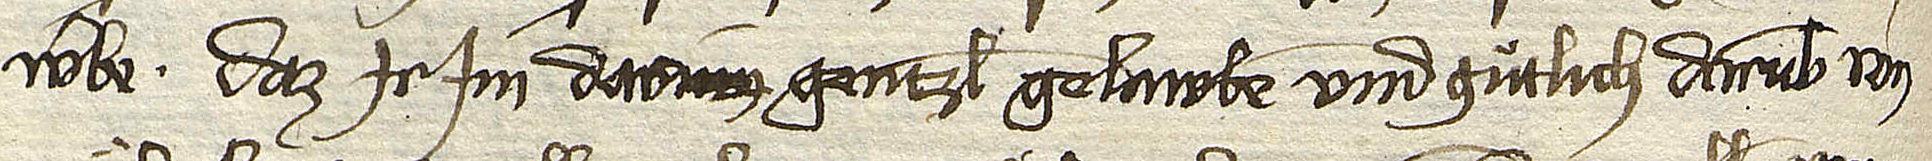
w*be . Daʒ Ir Im darinn gencʒl* gelawbe* vnd gütlich darub* von
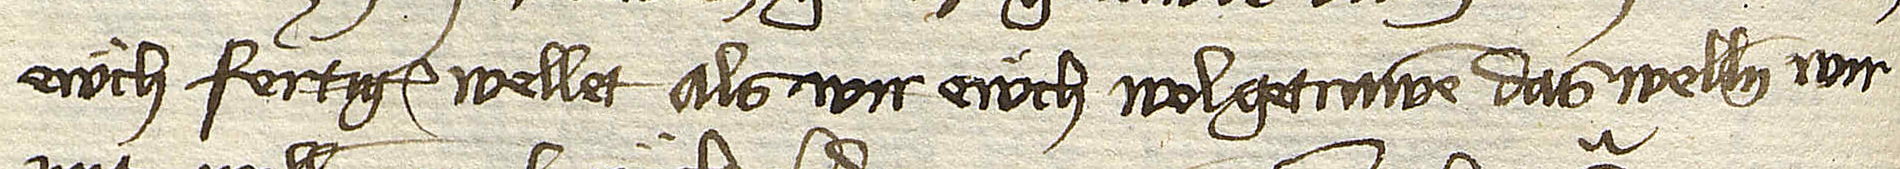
eẅch fertig* wellet als wir eẅch wolgetrawe* das welln* wir
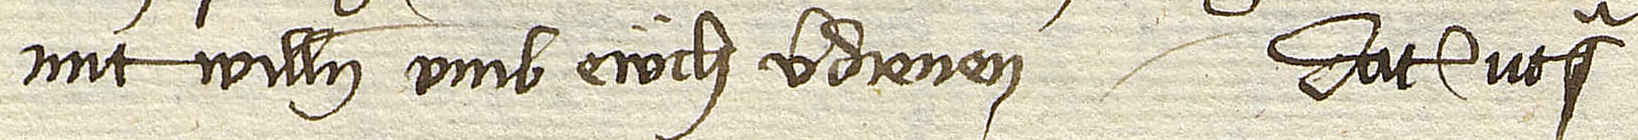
mit willn* vmb eẅch v*dienen / Dat* ut ſ*
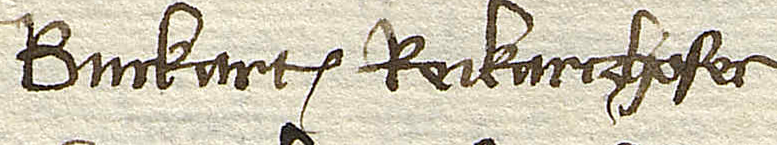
Burkart* Reikarcʒhofer
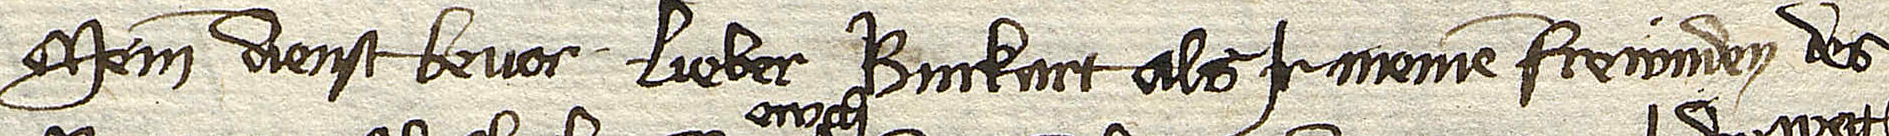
Mein* dienſt beuor / Lieber Burkart als Ir meine* freẅnden des
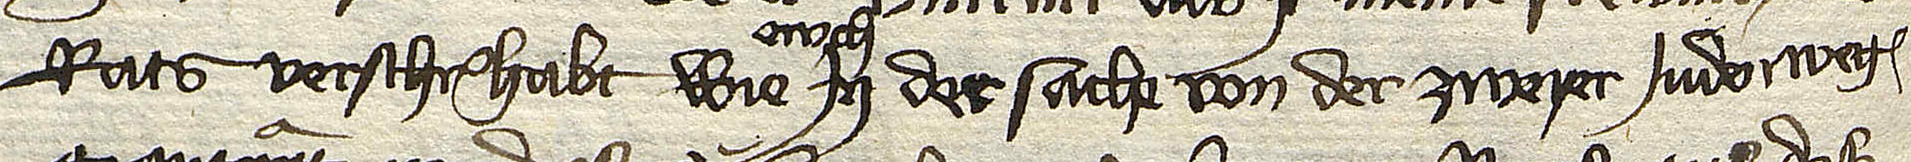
Rats verſchr* habt wie In der ſache von der ʒweyer Iuden weg*
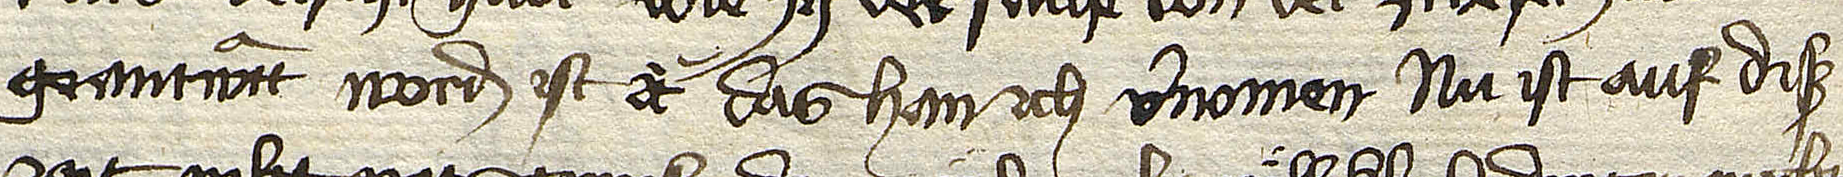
geantw*tt word* iſt ec* Das han ich v*nomen . Nu iſt auf diſʒ
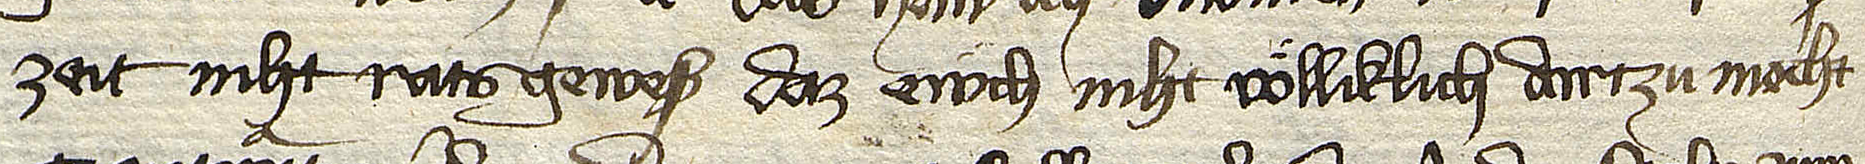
ʒeit niht rats geweſ* daʒ eẅch niht völliklich darcʒu mocht
